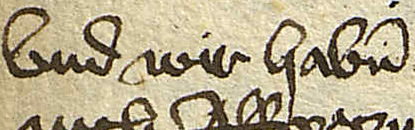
vnd wir habn*
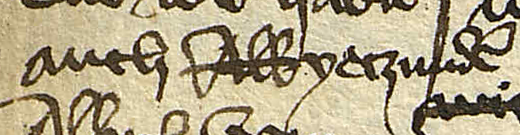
auch Alb yecʒund*
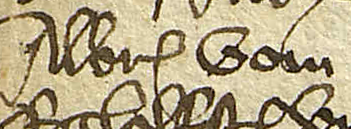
Albr* vom
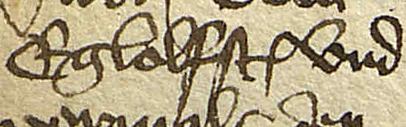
Eglolfſt* vnd
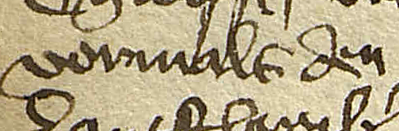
vormals den
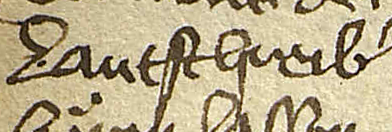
Lantſchreib*
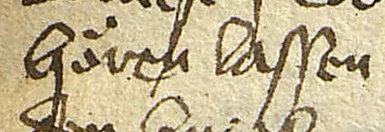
hören laſſen
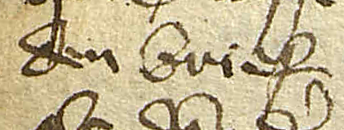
den brief
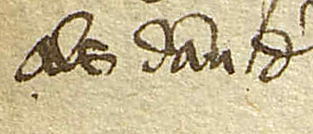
als dan* d*
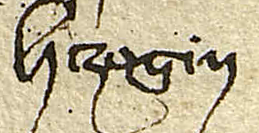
h*cʒogin
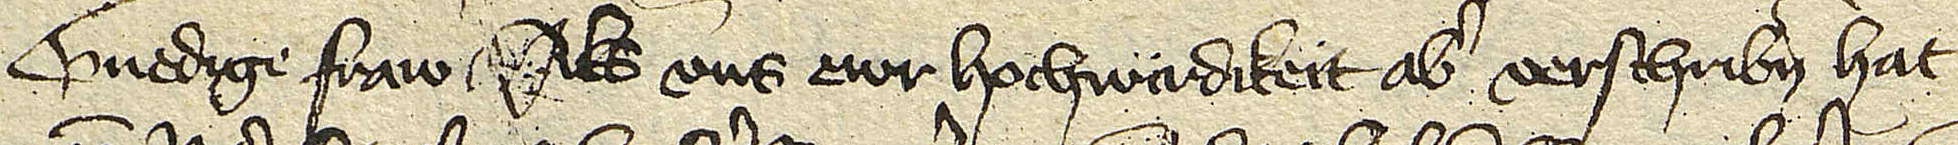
Gnedige fraw / Als vns ewr hochwirdikeit ab* verſchribn* hat
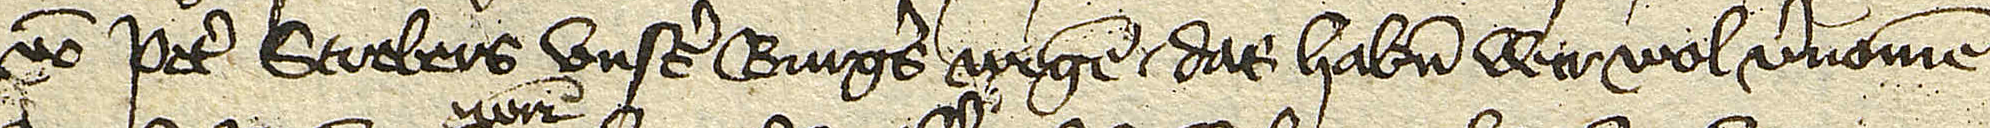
vo* Pet* Strebers vnſs* Burgs* wege* / das habn* wir wol v*nome*
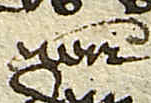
ewre*
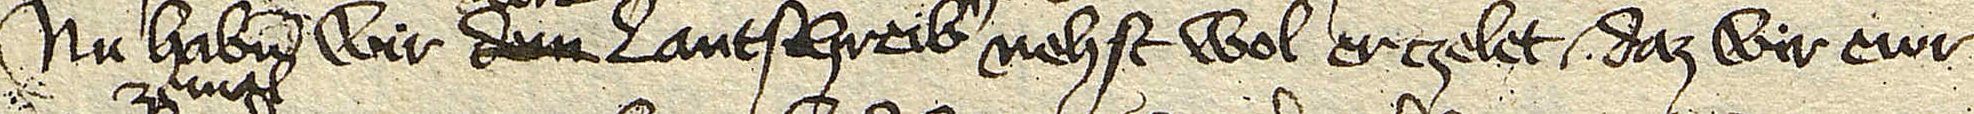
Nu habn* wir dem Lantſchreib* nehſt wol ercʒelet / daʒ wir ewr
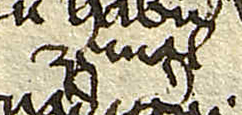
ʒemal
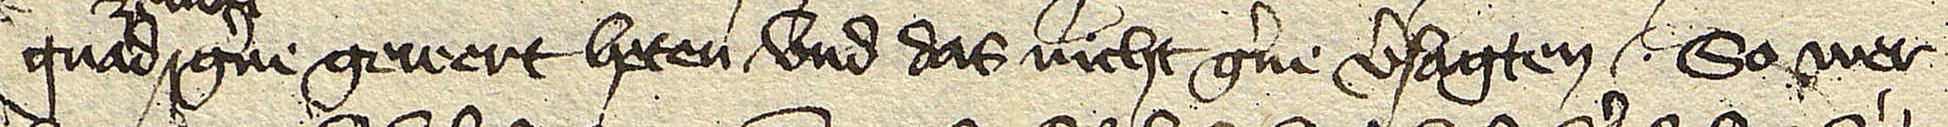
gnad g*ne gewert heten / vnd das nicht g*ne v*ſagten /. So wer
